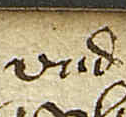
vnd
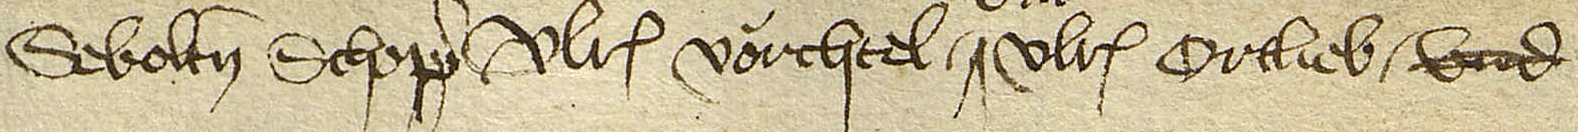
Seboltn* Schop* / vlr* vörchtel / vlr* Ortlieb / vnd
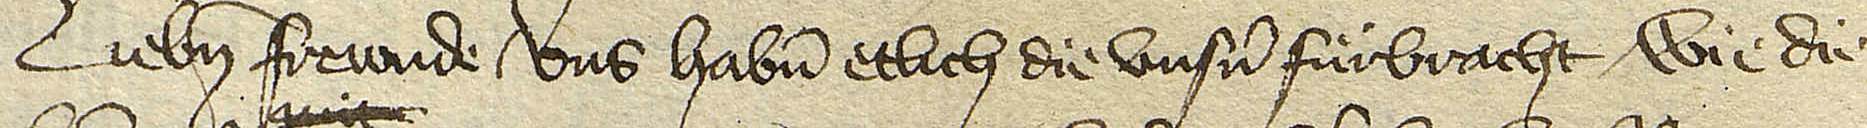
Liebn* frewnde / Vns habn* etliche die vnſn* fürbracht / wie die
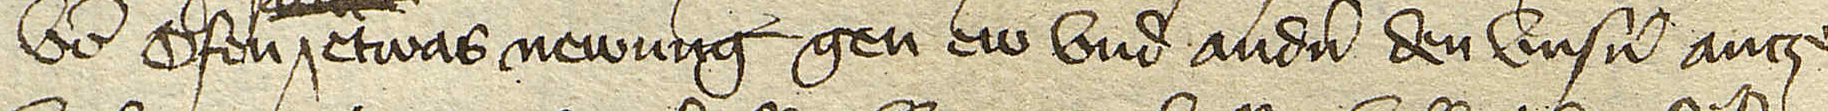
vo* Ofen etwas newung gen ew vnd andn* den vnſn* ancʒe
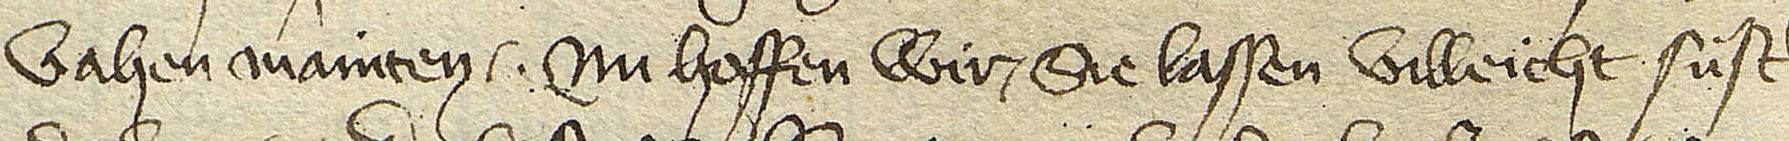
bahen mainten / . Nu hoffen wir / Sie laſſen villeicht ſüſt
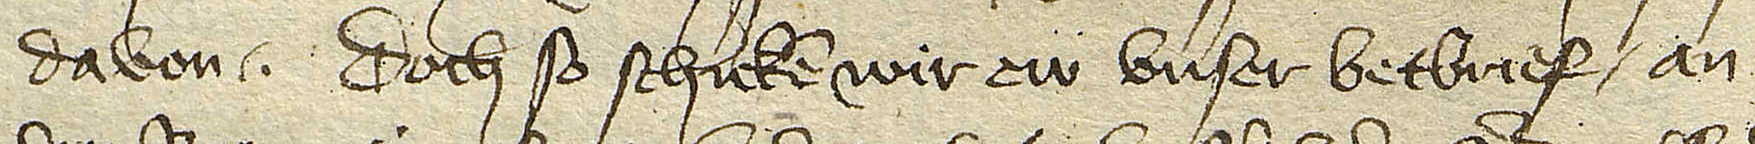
davon / . Doch ſo ſchicke* wir ew vnſer betbrief / an
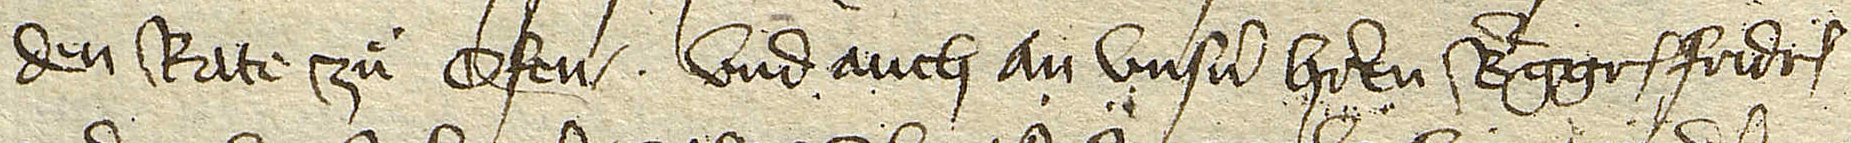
den Rate cʒü Ofen / . vnd auch an vnſn* hr*en B*ggr* fridr*
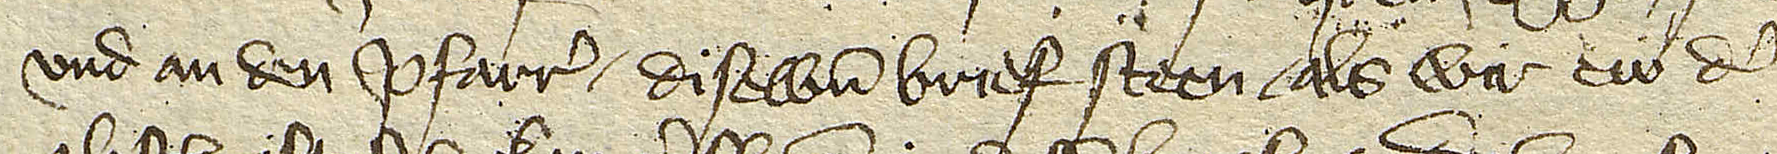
vnd an den Pfarr* / diſelbn* brief ſteen / als wir ew d*
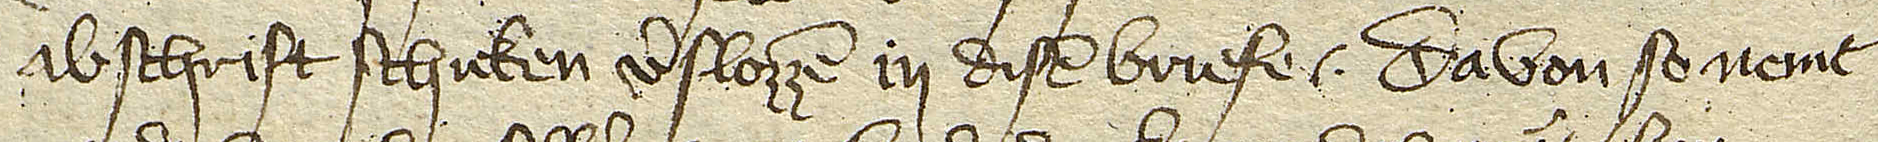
abſchrift ſchicken v*ſloʒʒe* in diſe* briefe / . Davon ſo nemt
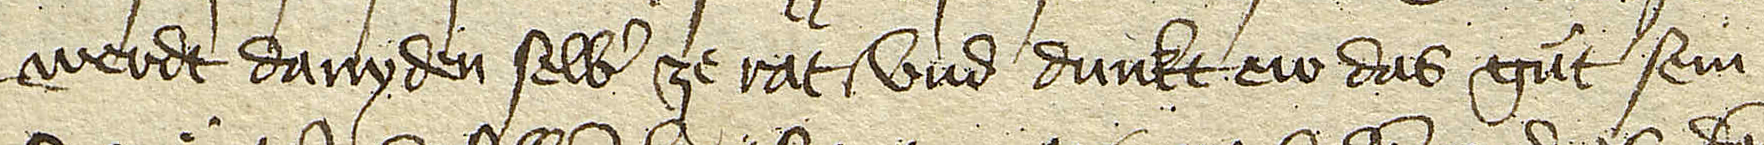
werdt danyden ſelb* cʒe rat / vnd dunkt ew das güt ſein
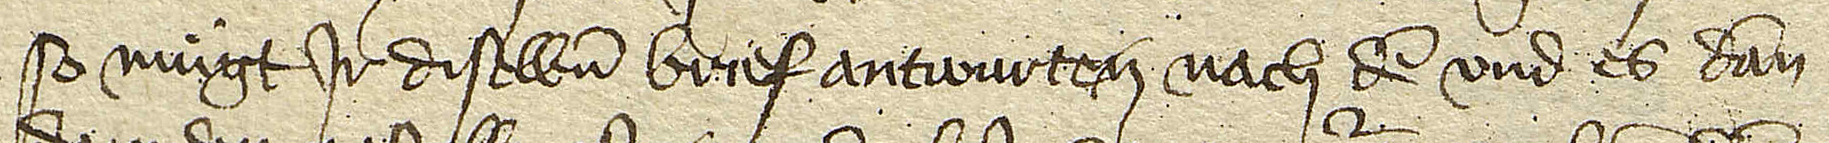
ſo mügt Ir diſelbn* brief antwurten nach de* vnd es dan*
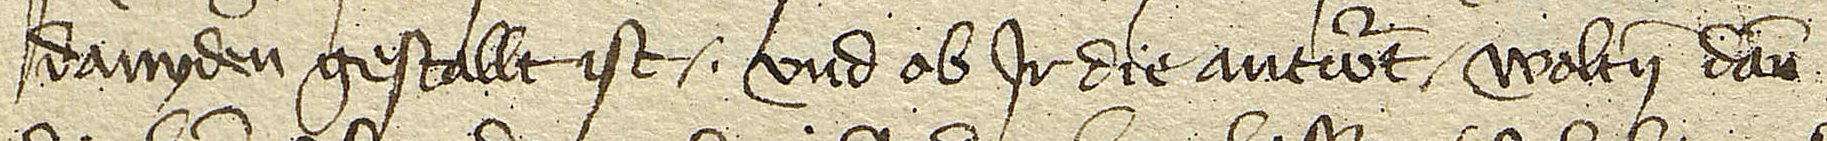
danyden geſtallt iſt / . vnd ob Ir die antw*t / woltn* dan*
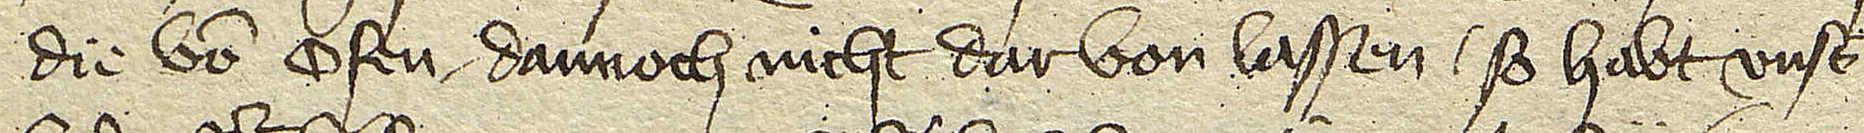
die vo* Ofen / dannoch nicht dar von laſſen / ſo habt vnſ*s
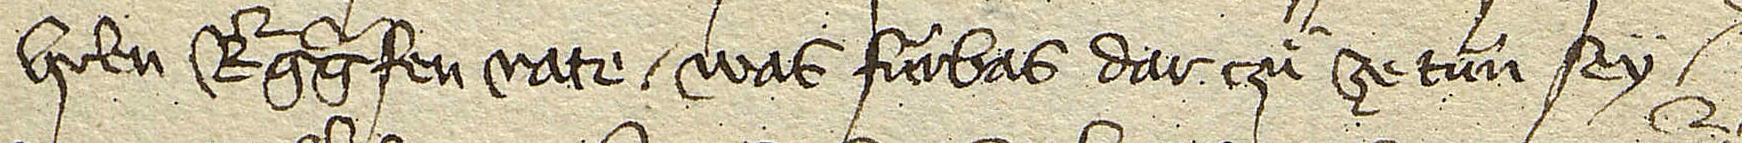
hr*en B*gg*fen rate / was fürbas dar cʒü cʒe tun ſey / .
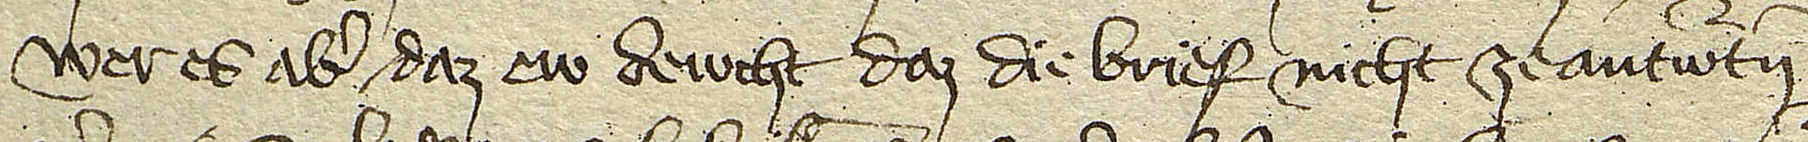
wer es ab* / daʒ ew dewcht daʒ die brief nicht cʒeantw*tn
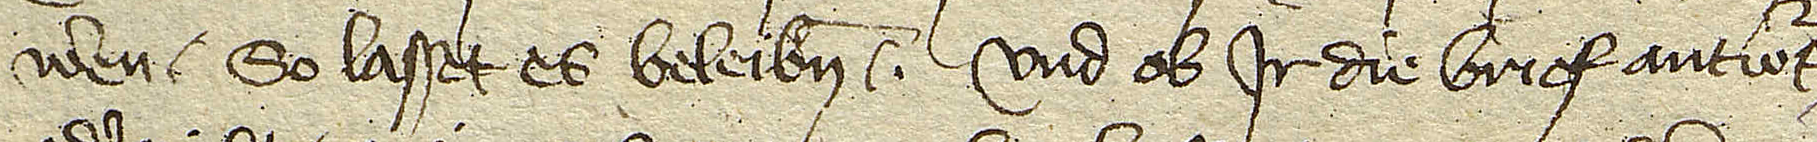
w*en / So laſſet es beleibn* / . vnd ob Ir die brief antw*t
